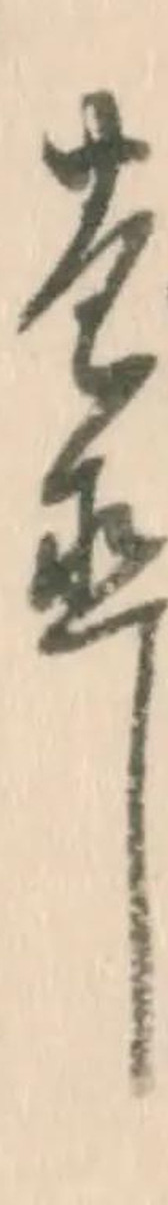巻直し
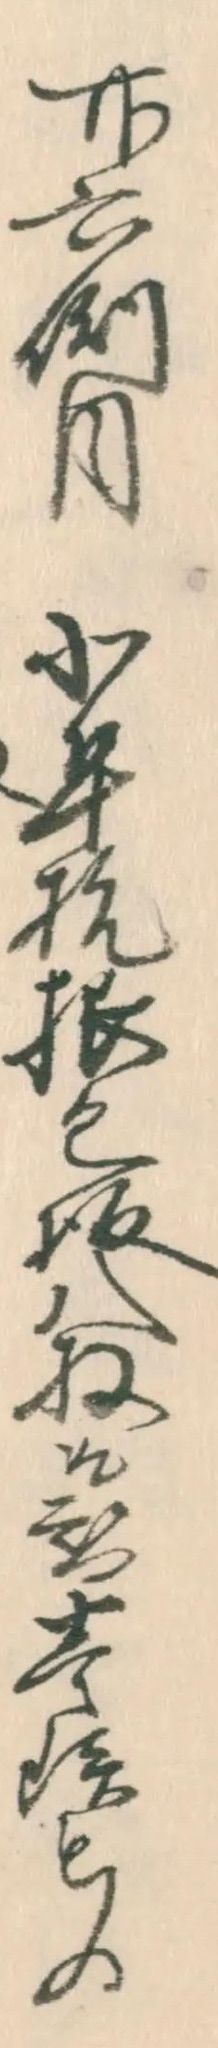廿六側目北耳杭根包板八枚取替巻鉄もの
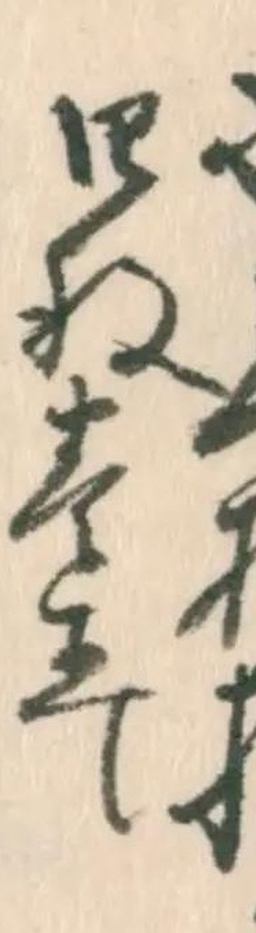四枚巻直し
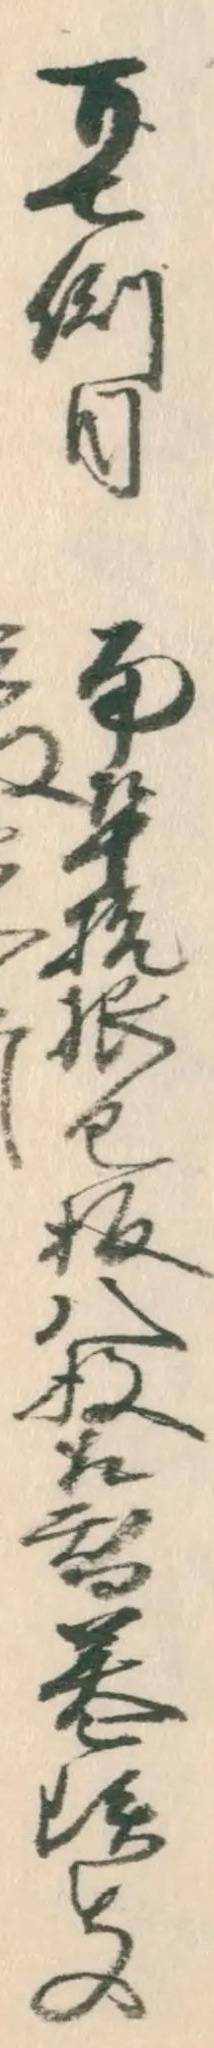廿七側目南耳杭根包板八枚取替巻鉄もの
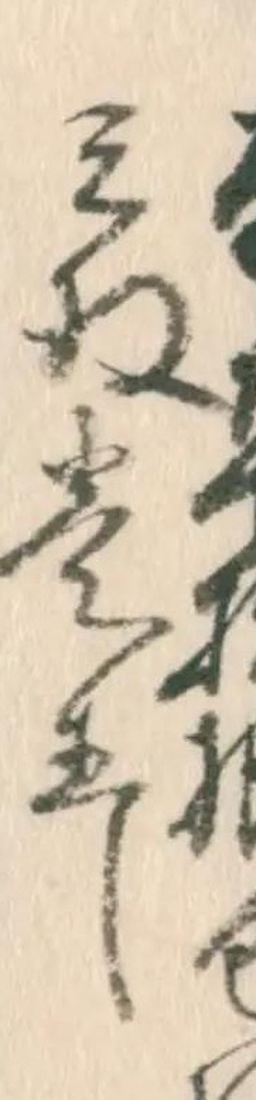三枚巻直し
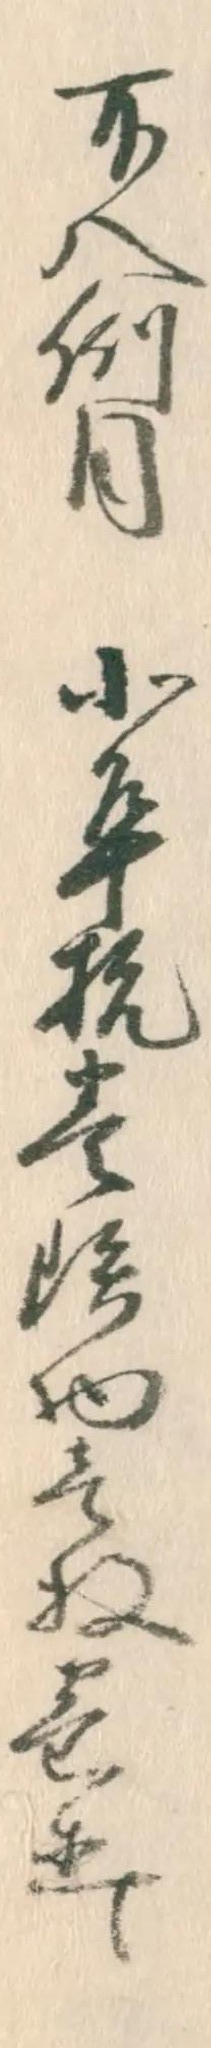廿八側目北耳杭巻鉄物壱枚巻直し
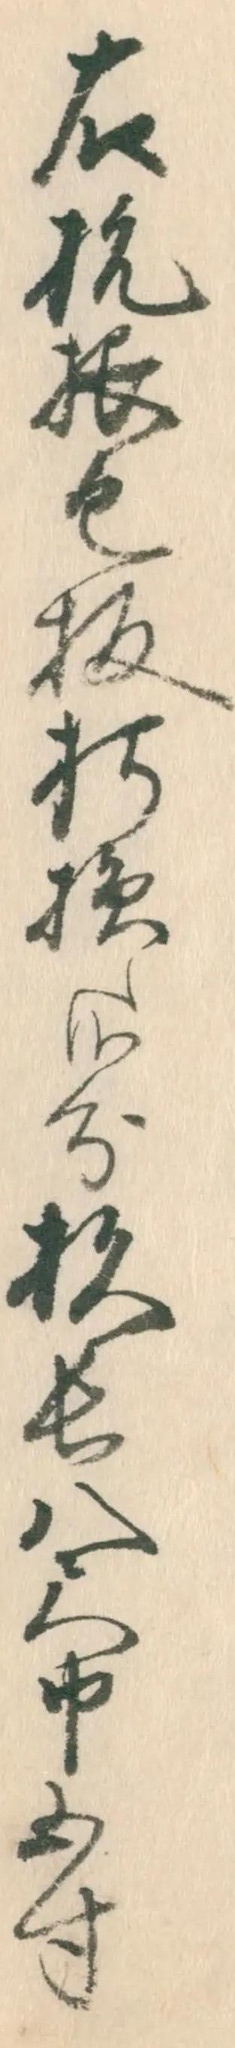右杭根包板朽損し候分杉長八尺巾五寸

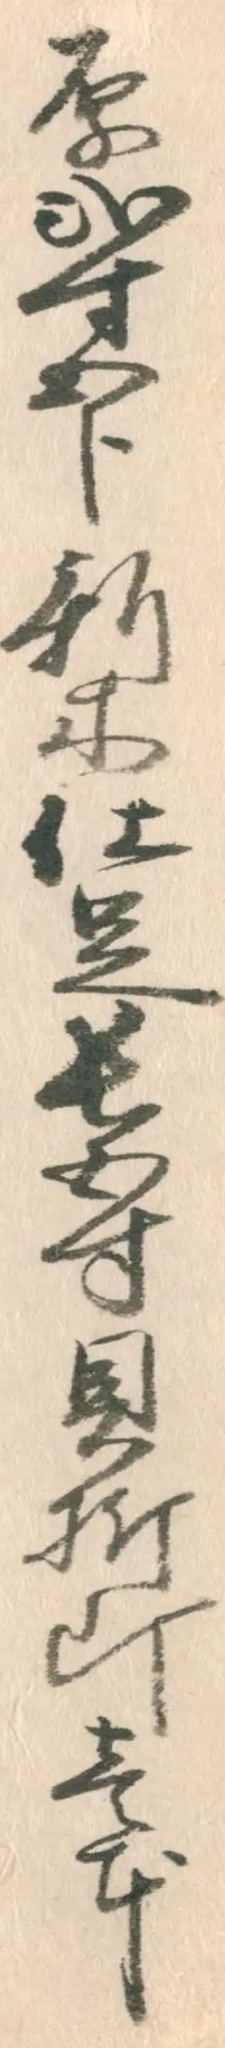厚弐寸五分新木仕足長五寸貝折釘壱本
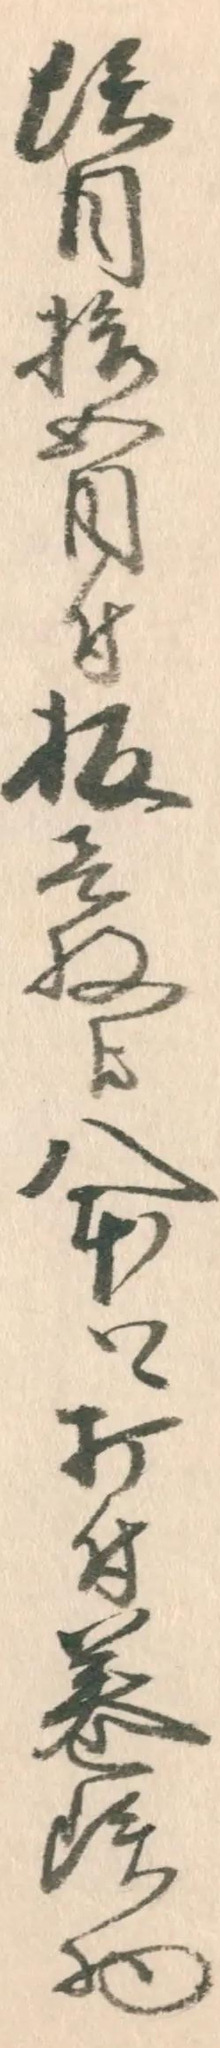鉄目拾五目付板壱枚え八本ツヽ打付巻鉄物
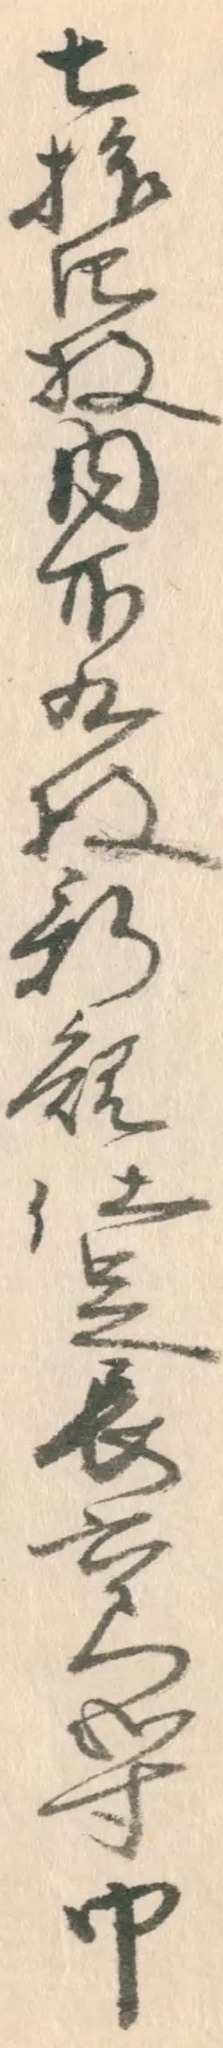七拾四枚内廿九枚新規仕足長六尺弐寸巾
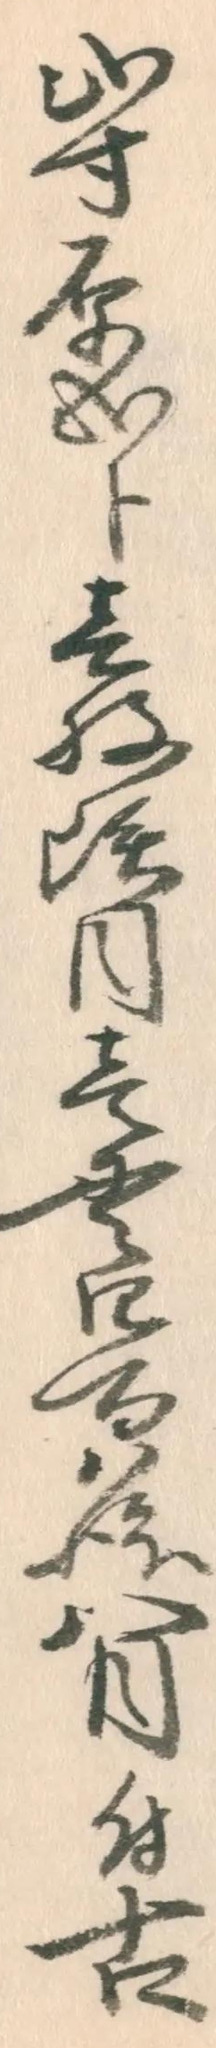弐寸厚弐分壱枚鉄目壱貫四百八拾八目付古
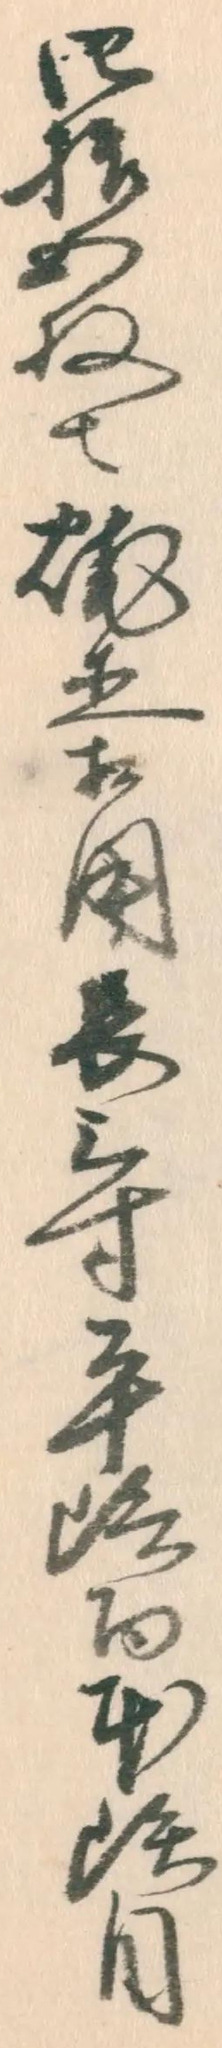四拾五枚は焼直相用長三寸平鋲百本鉄目
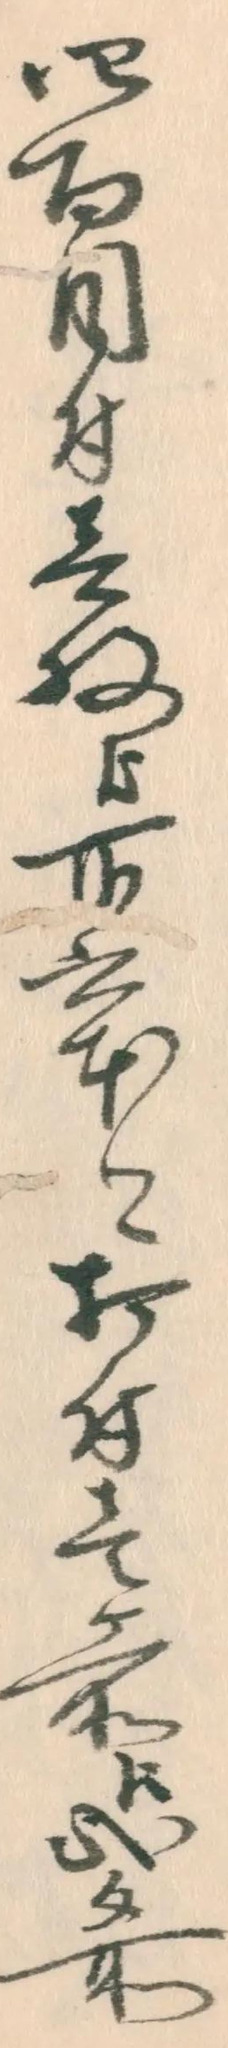四百目付壱枚え廿六本ツヽ打付壱ケ所え弐タ所
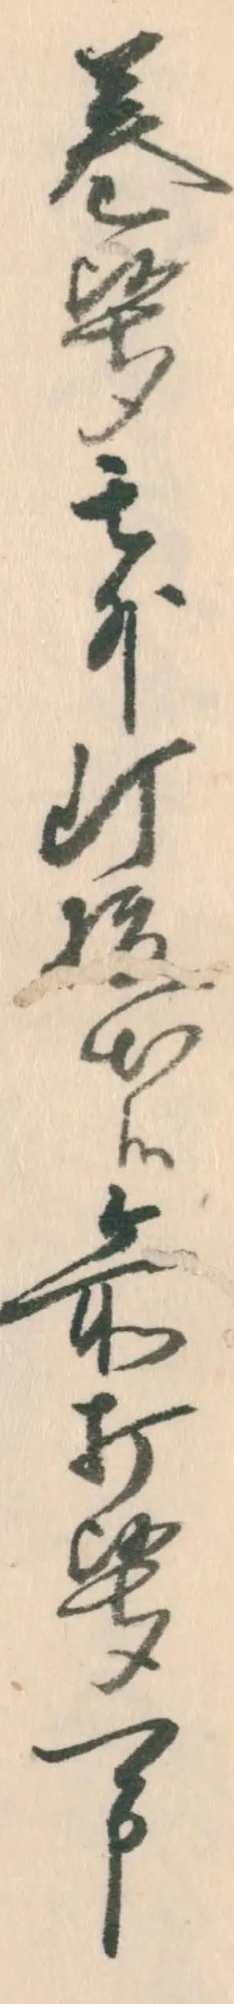巻堅メ其外釘抜出候ケ所打堅メ可申
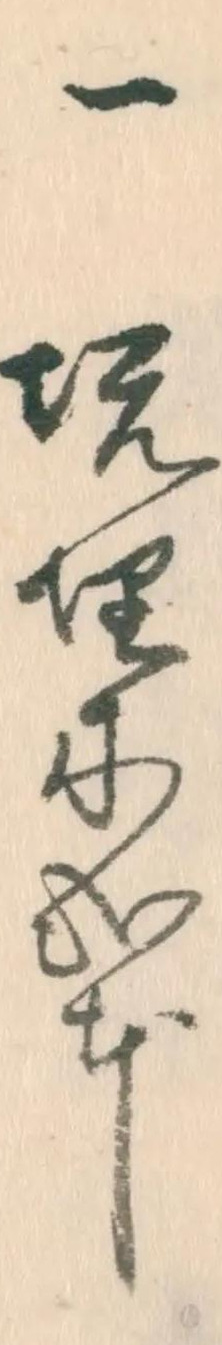一杭埋木弐本
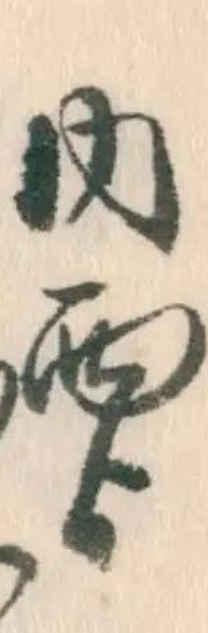内西ゟ
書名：三橋 17巻. [7] 三橋小破御修復書留　但御奉行御掛リ替地震潰橋番屋　嘉永四亥年より安政二卯年迄　上
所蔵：国立国会図書館 National Diet Library, JAPAN
